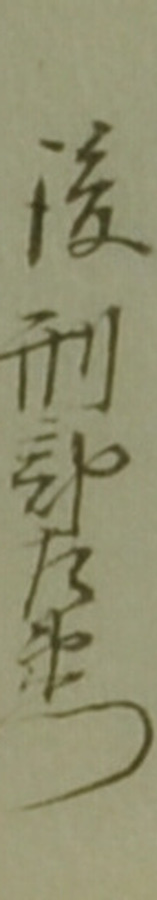後刑部左衛門
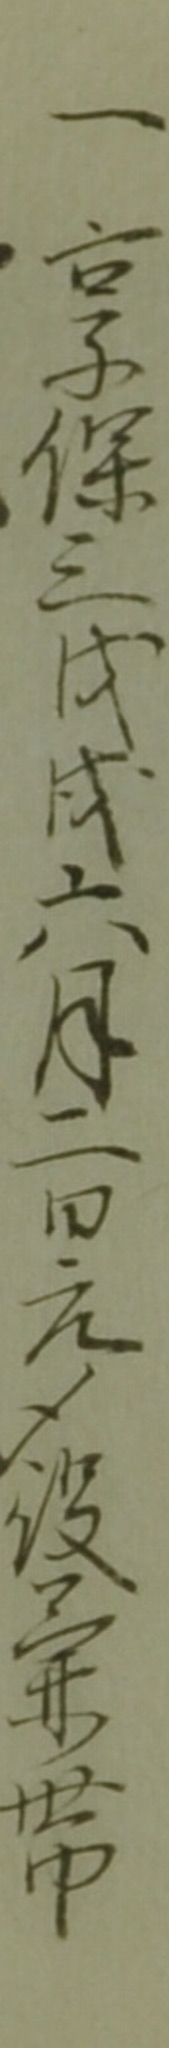一享保三戊戌六月二日元〆役兼帯
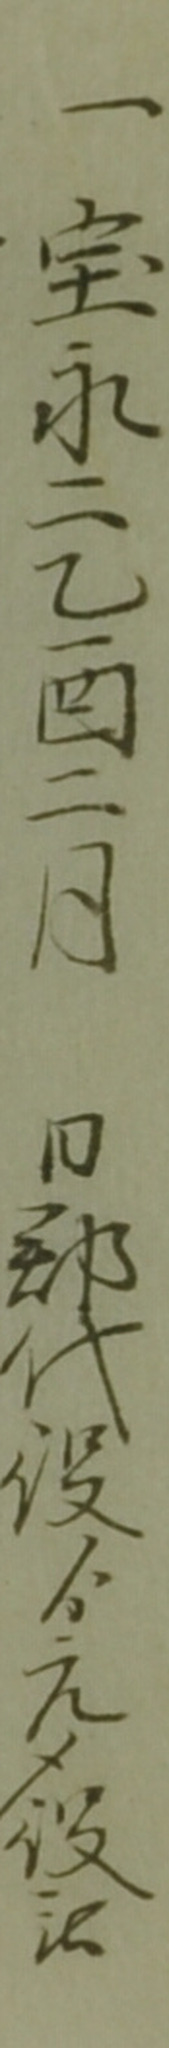一宝永二乙酉二月日郡代役ゟ元〆役被
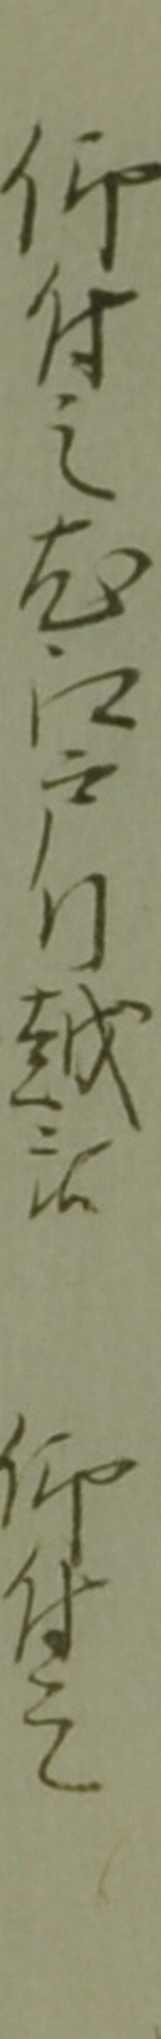仰付之尤江戸引越被仰付之
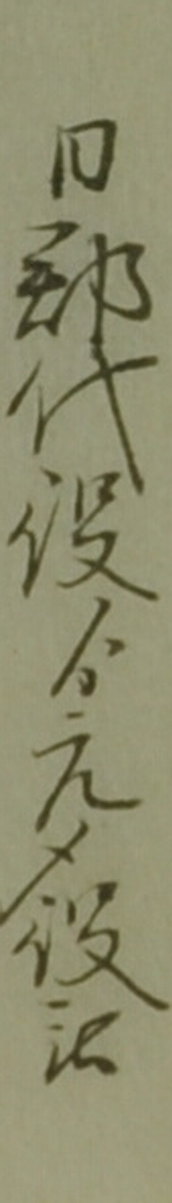諸筆吟味役ゟ元〆役被
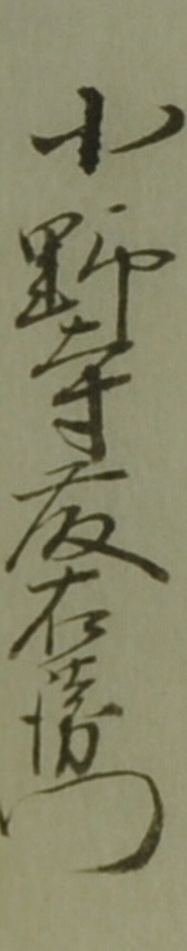小野寺籐右衛門
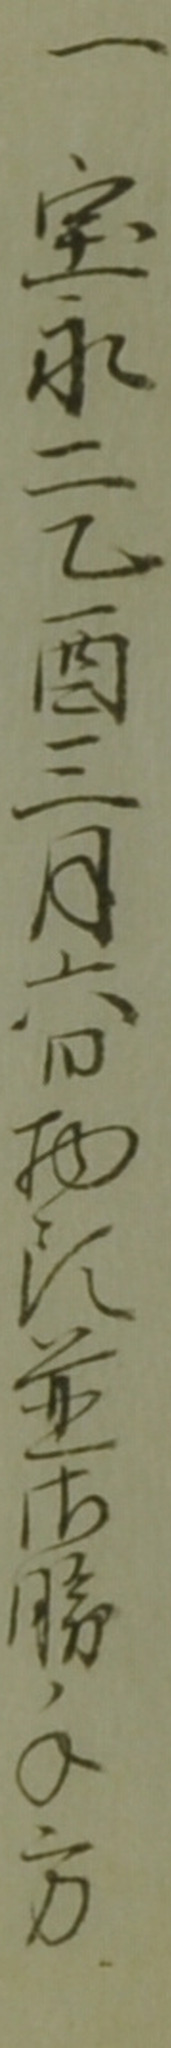一宝永二乙酉三月六日物頭並御勝手方
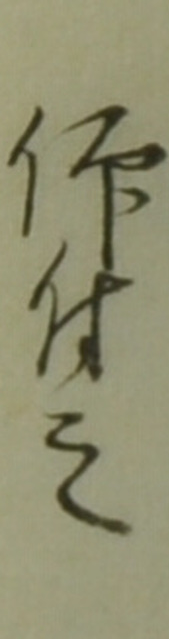仰付之
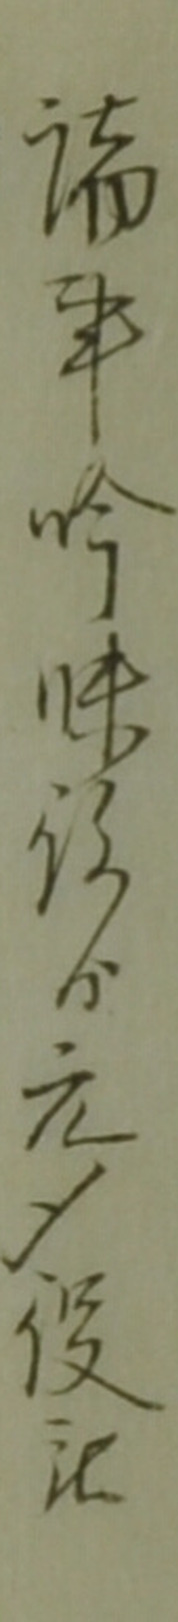諸筆吟味役ゟ元〆役被

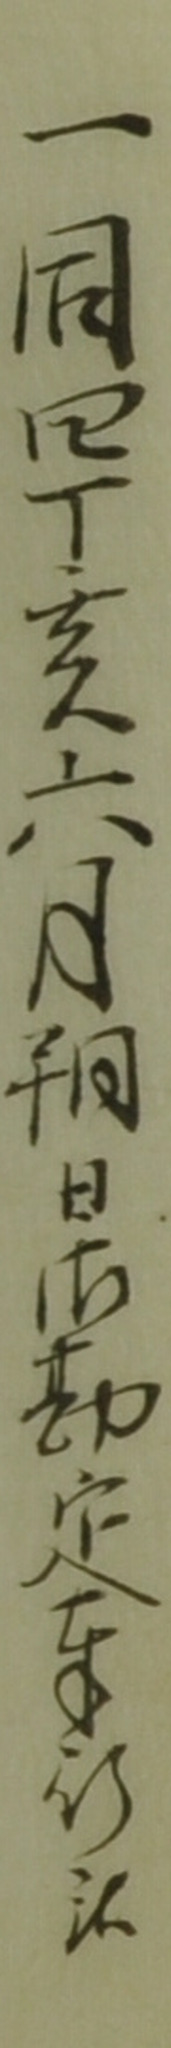一同四丁亥六月朔日御勘定奉行被
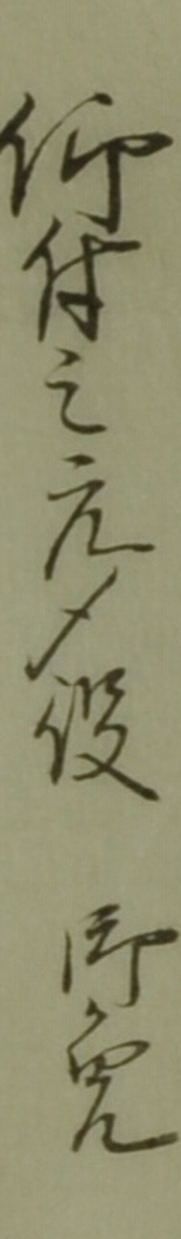仰付之元〆役御免
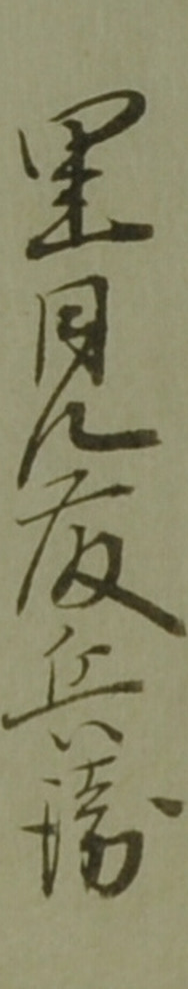里見籐兵衛
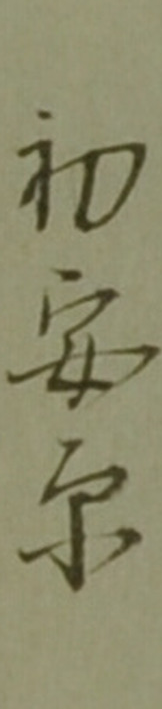初安原
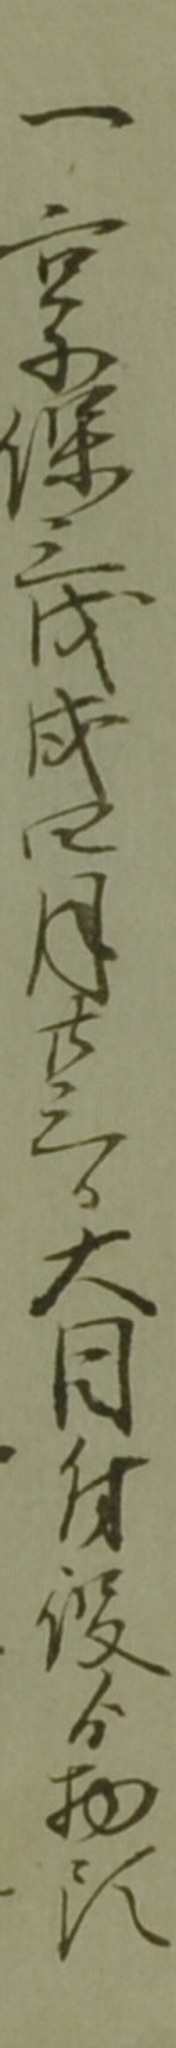一享保三戊戌四月廿三日大目付役ゟ物頭
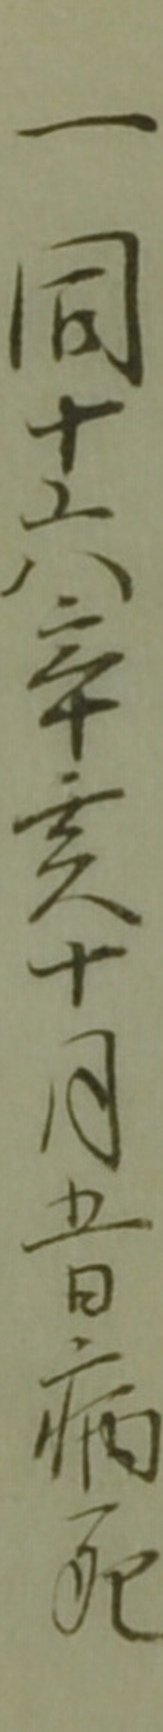一同十六辛亥十月五日病死
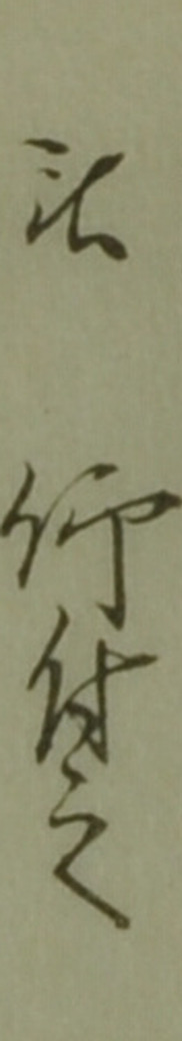被仰付之
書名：諸御役代々録（七）
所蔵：伊那市立高遠町図書館・合同会社AMANE
